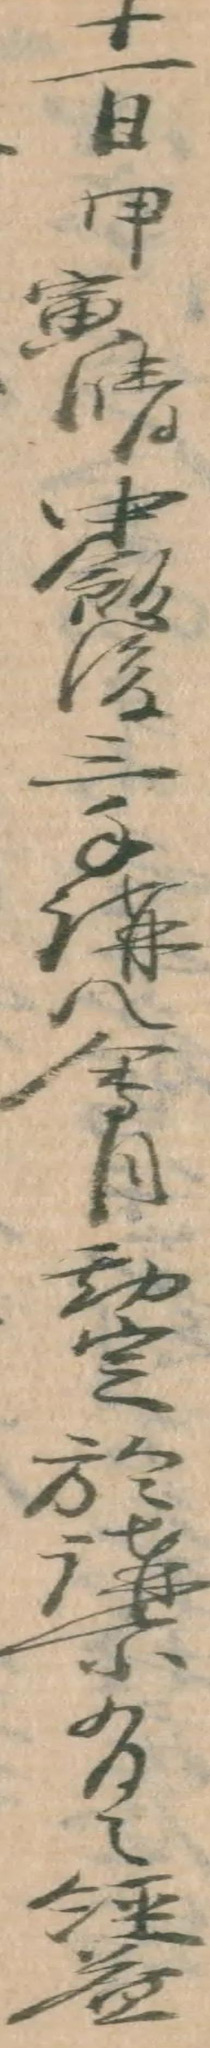十一日甲寅晴中飯後三手講八會目勘定於講所有之経益
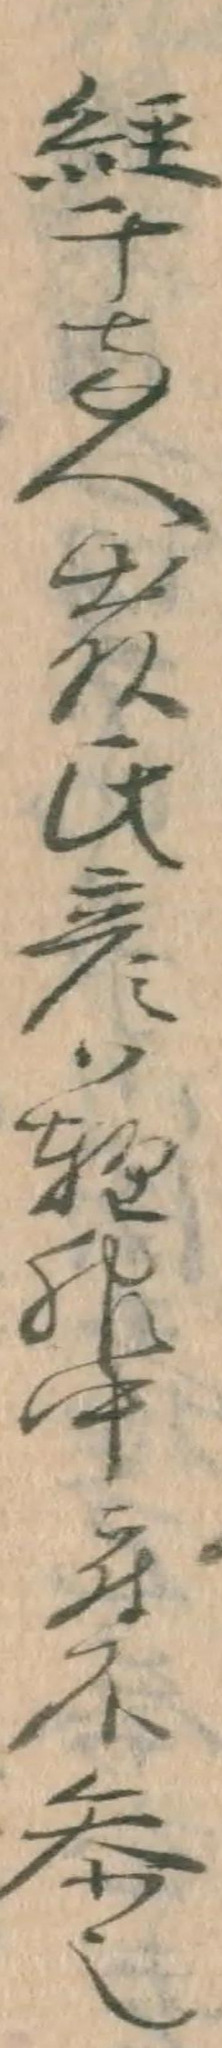経千両人出頭氏彦ハ軽服中ニ付不参也
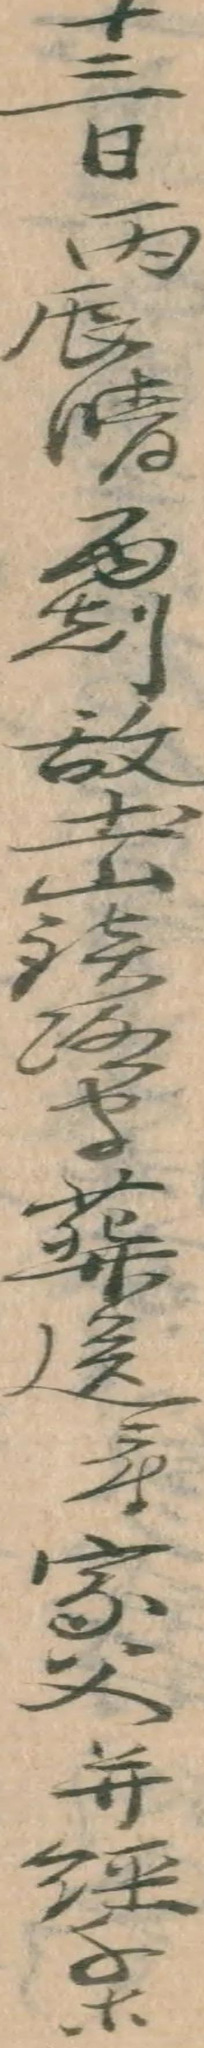十三日丙辰晴酉刻故土山淡路守葬送ニ付家父并経千等
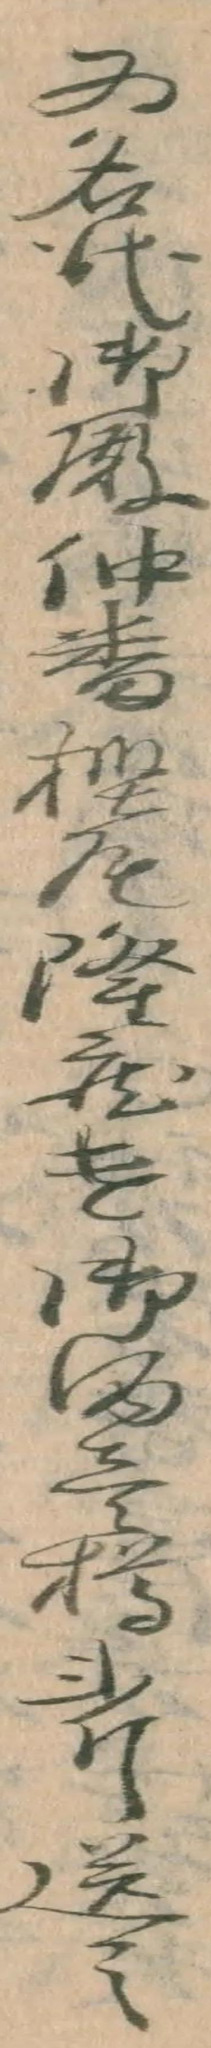為名代御殿仲番樫尾隆蔵遣御酒壱樽弐斤送之
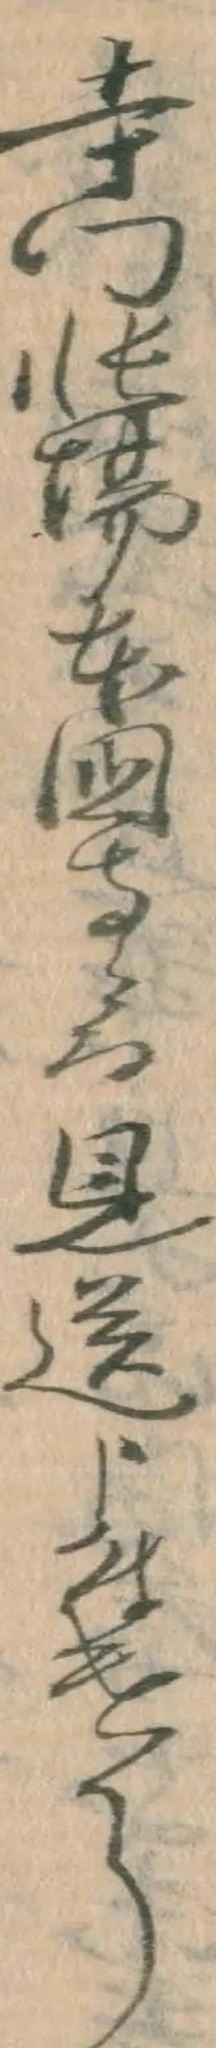寺門帳場本國寺ニ而見送申付遣了
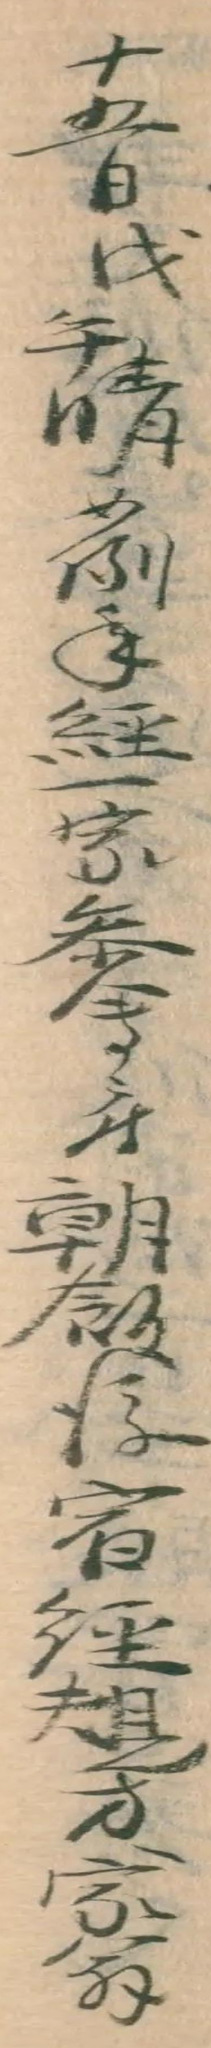十五日戊午晴如例年経一家参會ニ付朝飯後宿経規方ヘ家翁
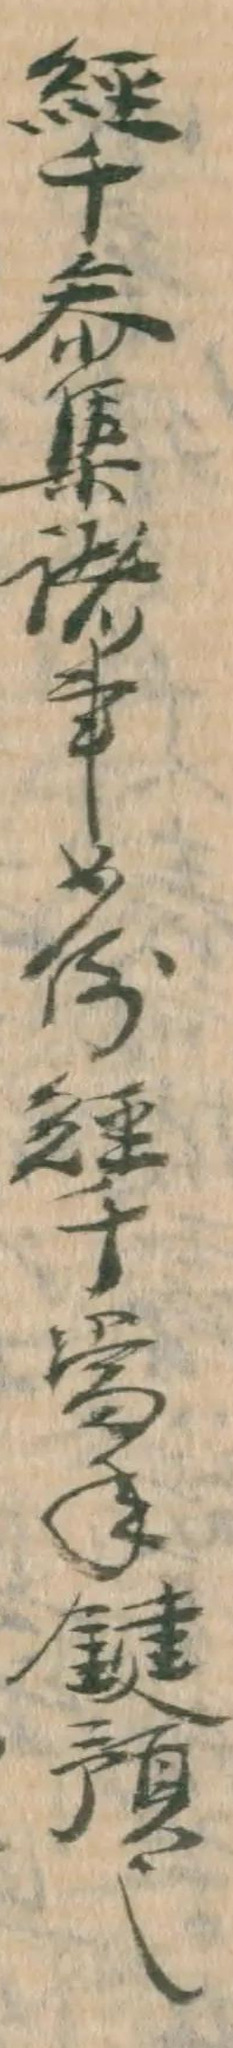経千参集諸事如例経千當年鍵預也
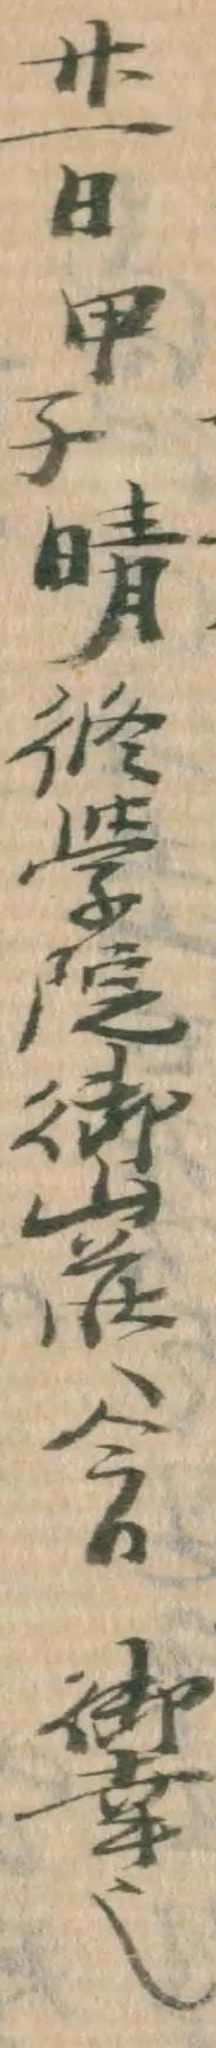廿一日甲子晴修學院御山荘へ今日御幸也
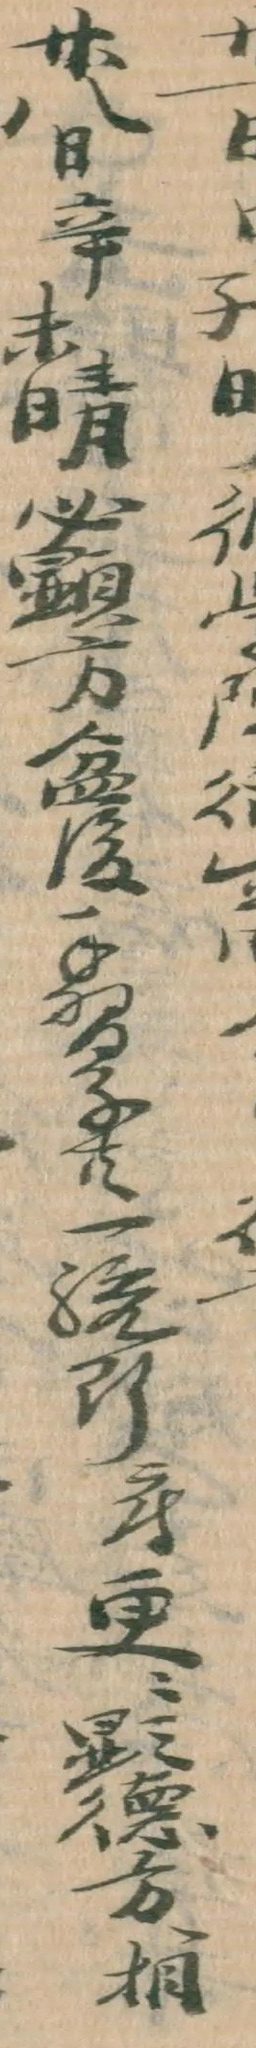廿八日辛未晴必顕方盆後手習子共一統断ニ付更ニ顕徳方へ相
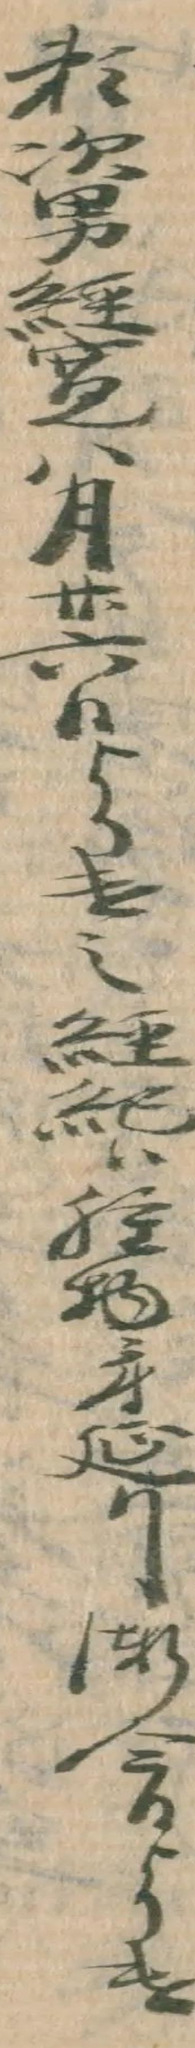頼次男経寛八月廿六日より遣之継紀ハ腫物ニ付延引漸今日より遣
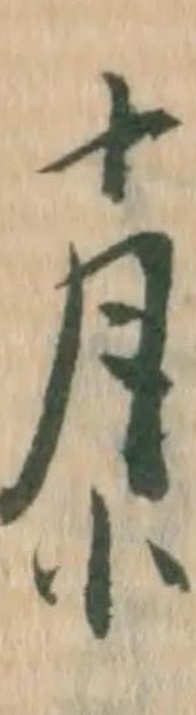十月小
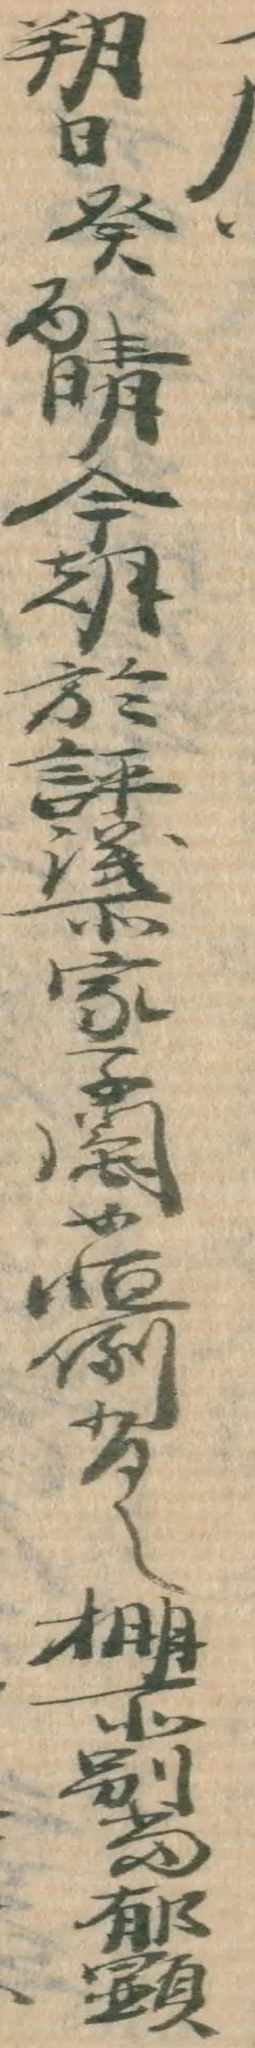朔日癸酉晴今朝於評議所家子鬮如恒例有之棚所別當郁顕
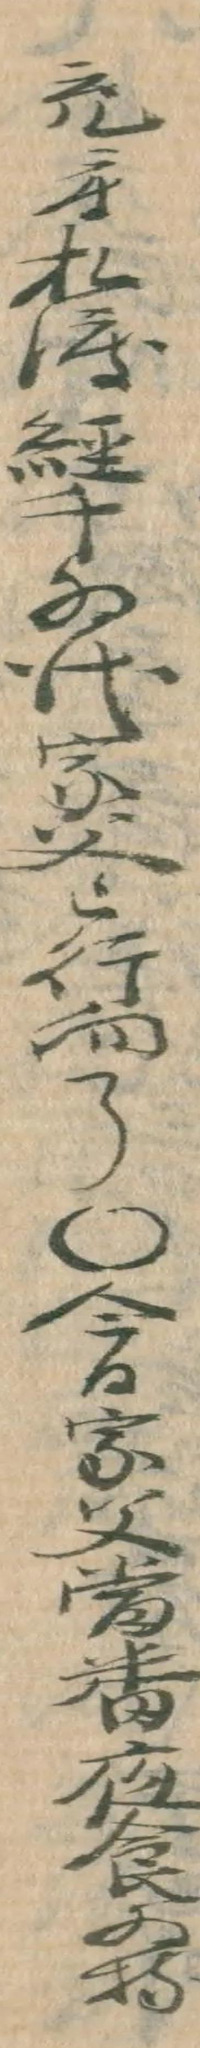充ニ付札渡経千為代家父被行向了○今日家父當番夜食為持
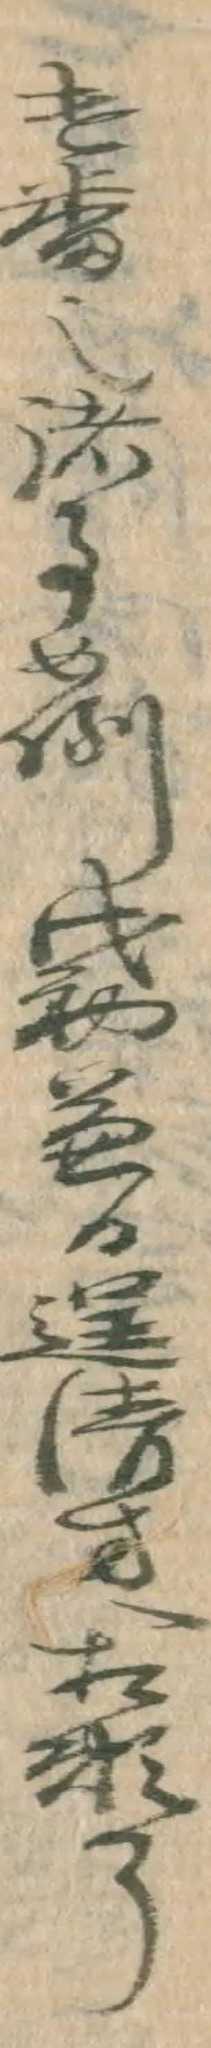遣番也諸事如例代勤兼而逞清方へ相頼了
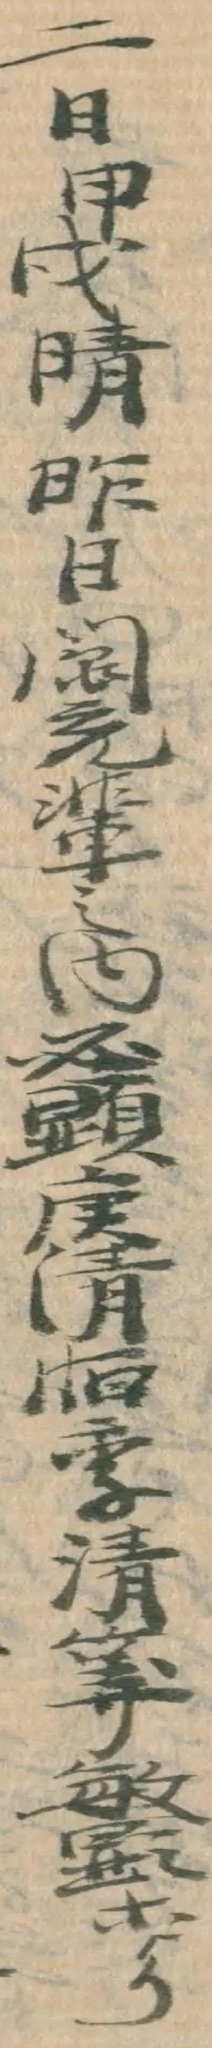二日甲戌晴明日鬮充輩之内必顕庚清恒季清算敏顕等より
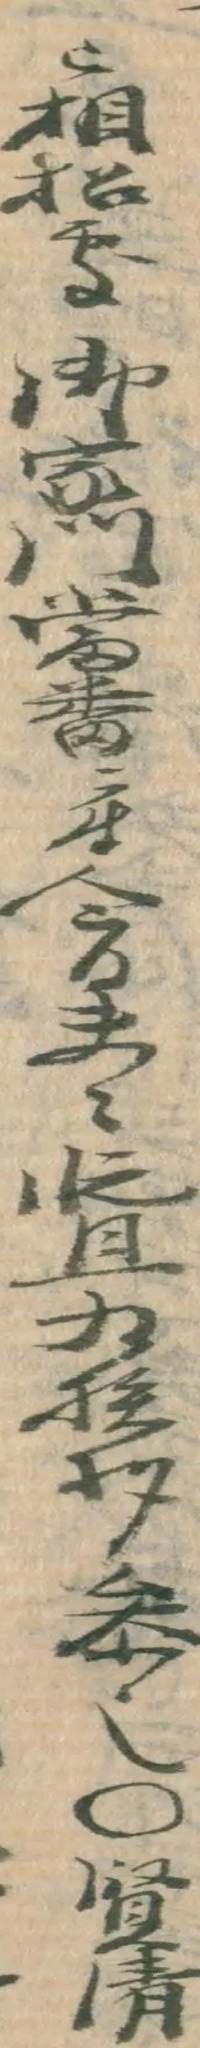被相招處御家門當番二付今日夫々祝且為挨拶参之○賢清
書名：賀茂社記録. 第65冊
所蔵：国立国会図書館 National Diet Library, JAPAN
